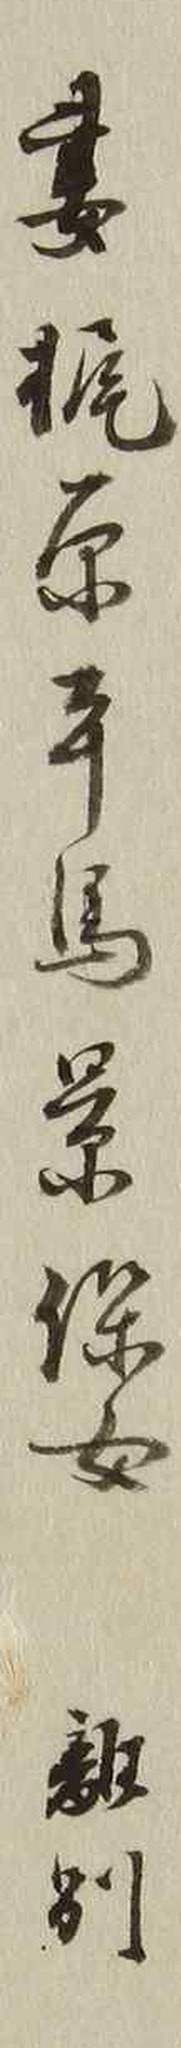妻梶原平馬景保女離別
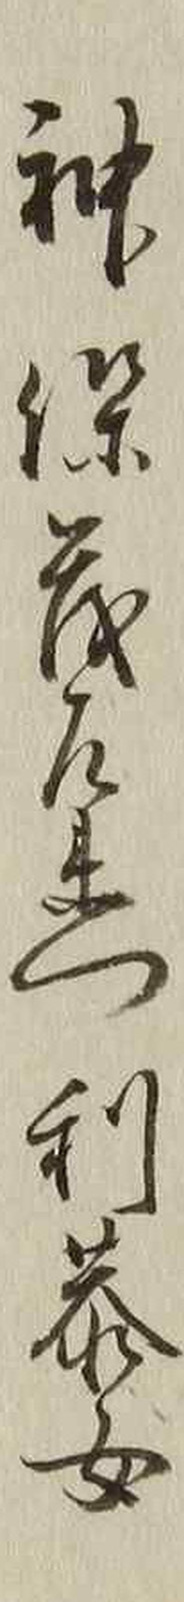神保茂左衛門利泰女
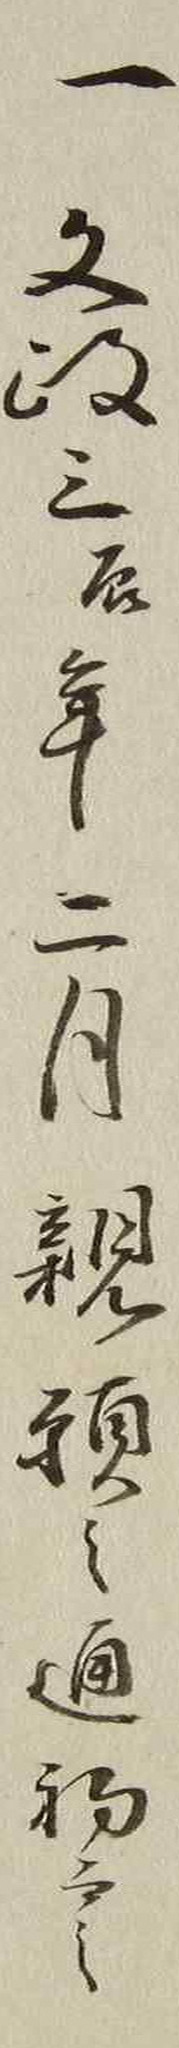一文政三辰年二月親願之通初而之
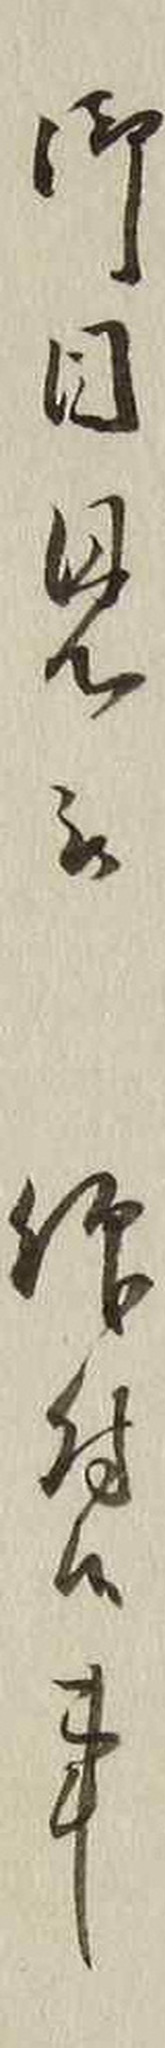御日見被仰付候事
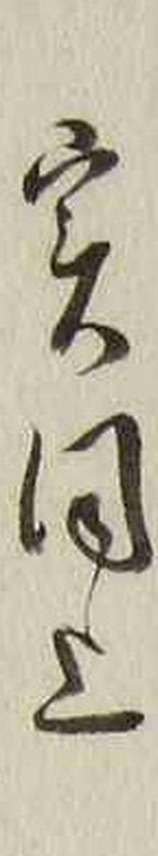実同上
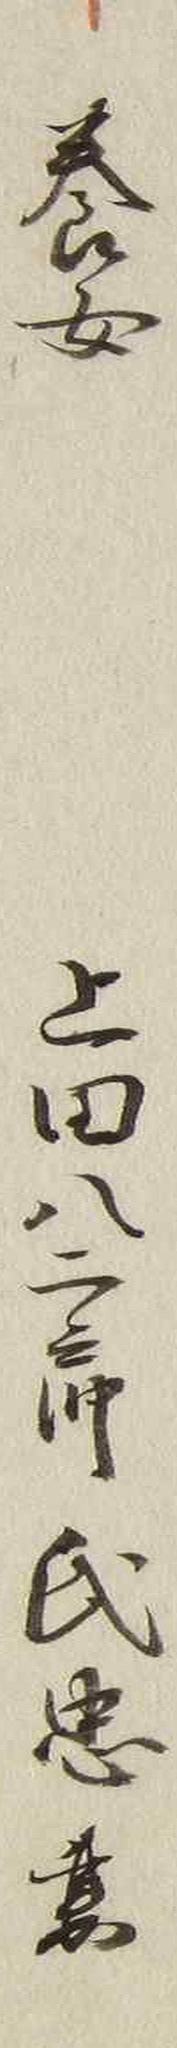養女上田八二郎氏忠妻

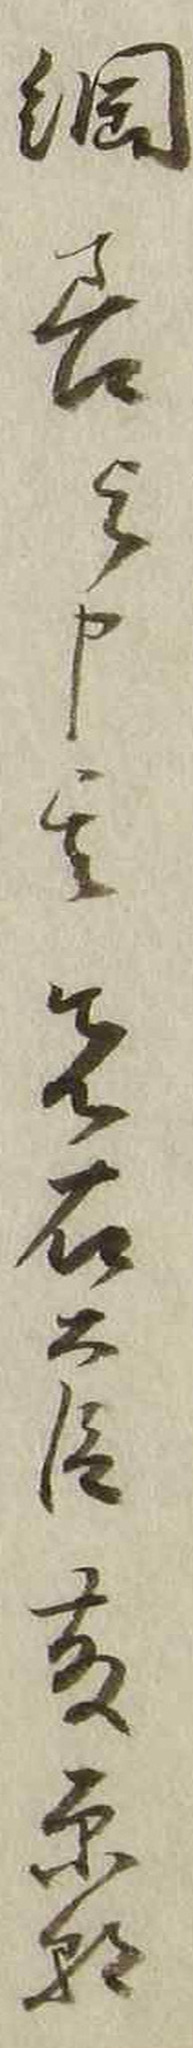綱善と申其先右太臣藤原朝
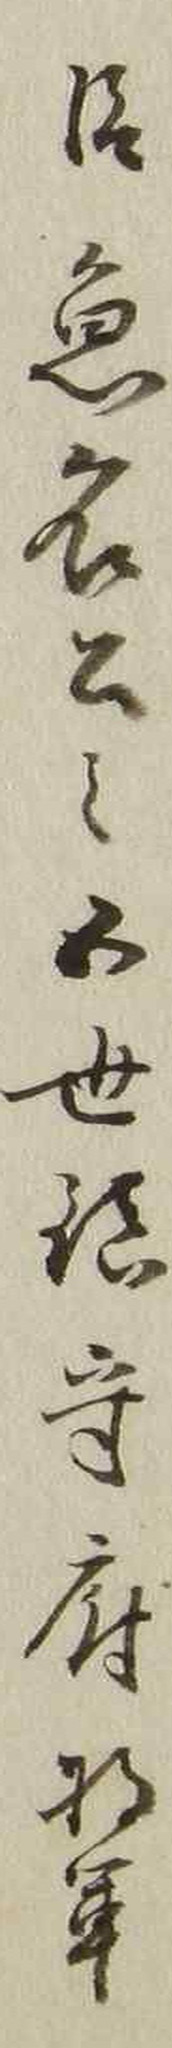臣魚名公之五世鎮守府将軍
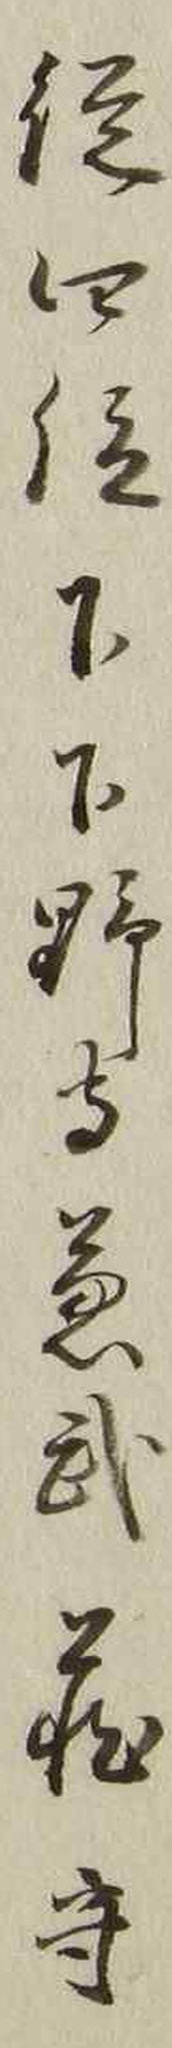従四位下下野守兼武蔵守
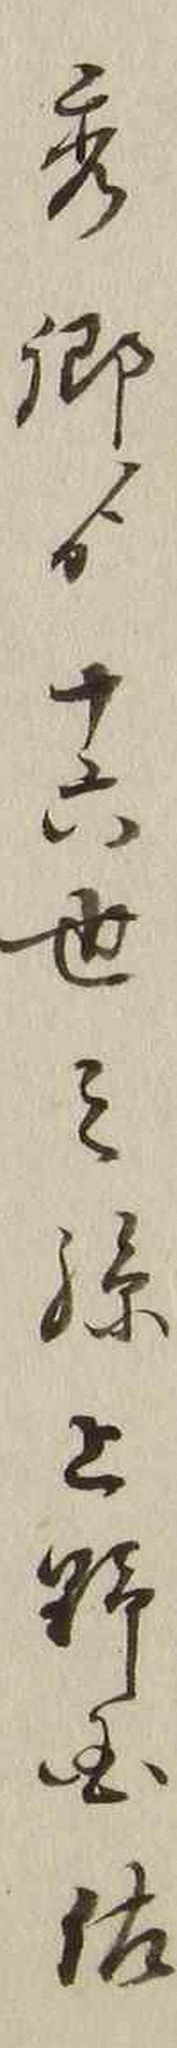秀郷ゟ十六世之孫上野国佐
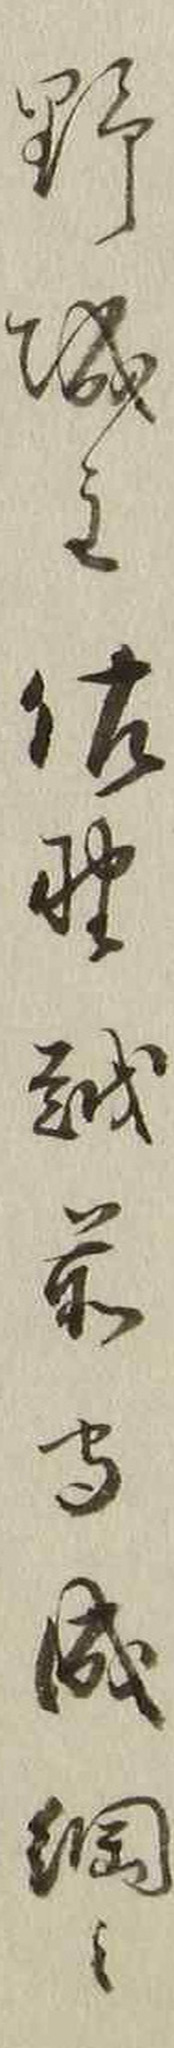野城主佐野越前守成綱之
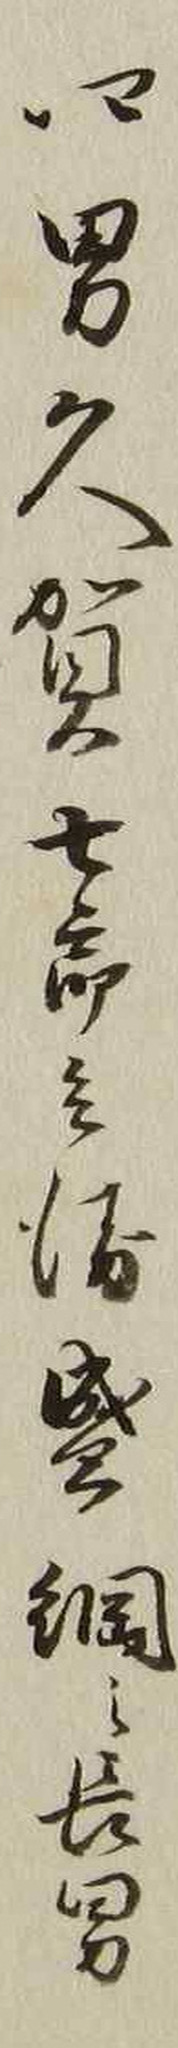四男久賀七郎兵衛盛綱之長男
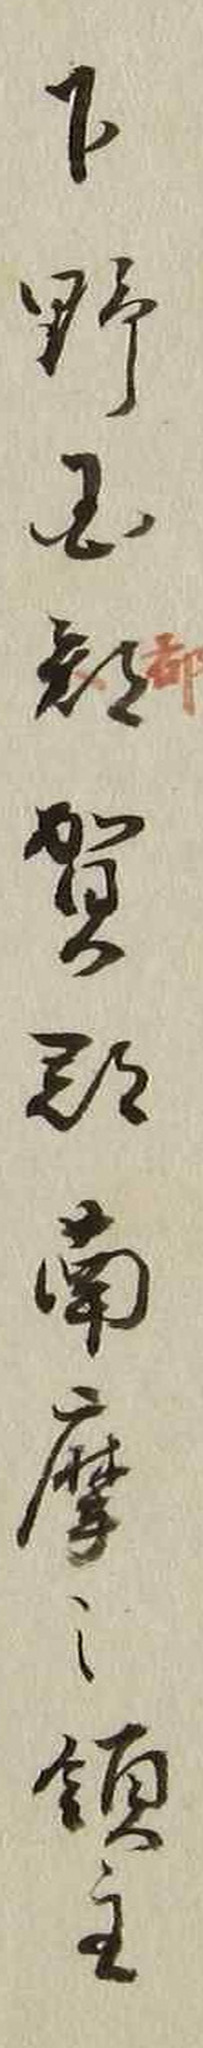下野国顔賀郡南摩之領主
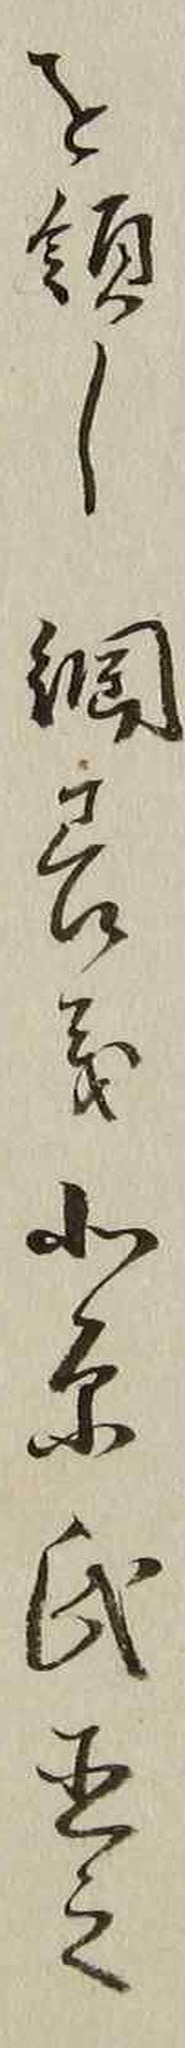を領し綱善義北条氏直之
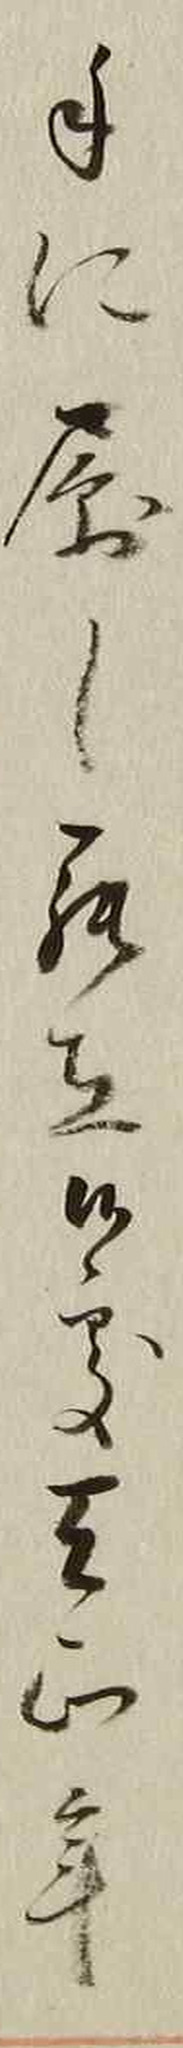手に属し罷在候処天正六年
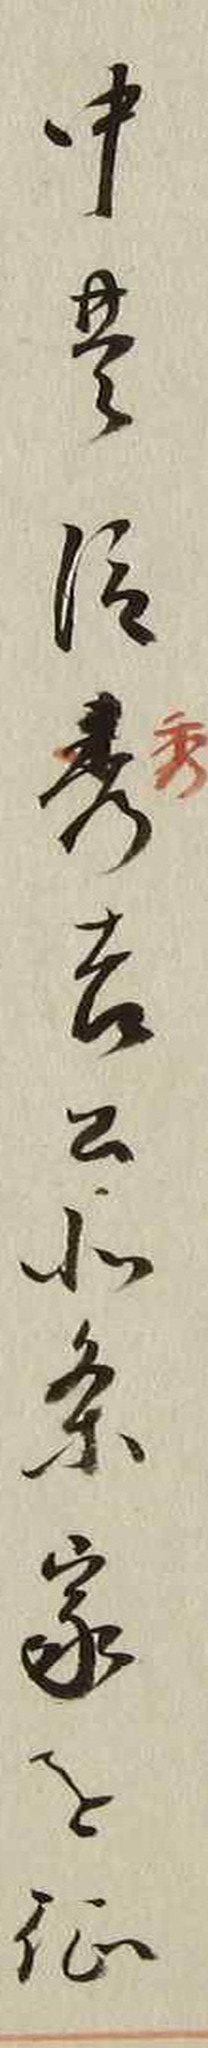中豊臣秀吉公北条家を征
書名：諸士系譜　巻之159　な之部1
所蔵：会津若松市立会津図書館
